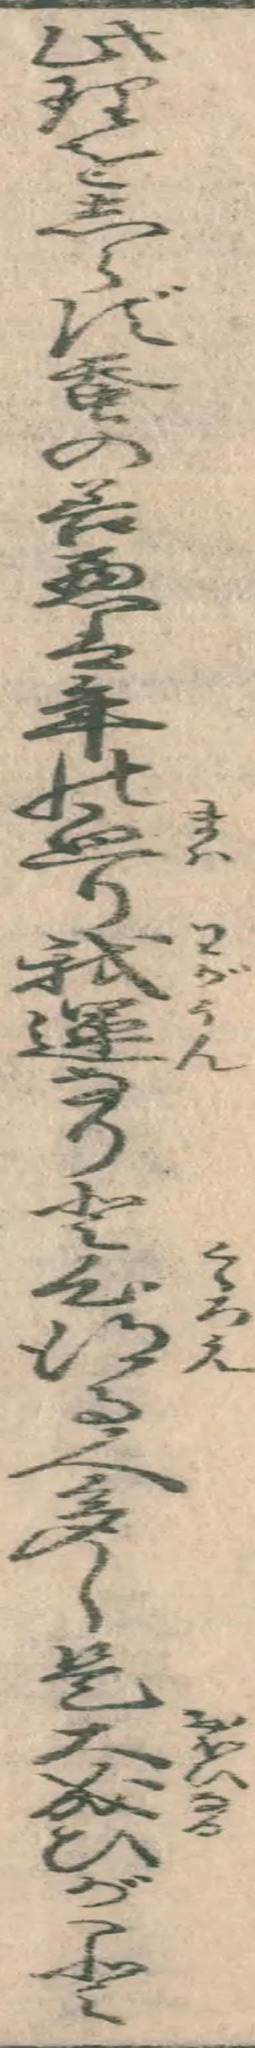此理をしらず蚕の善悪は年の廻り我運なりと心得る人多し是大成ひがこと
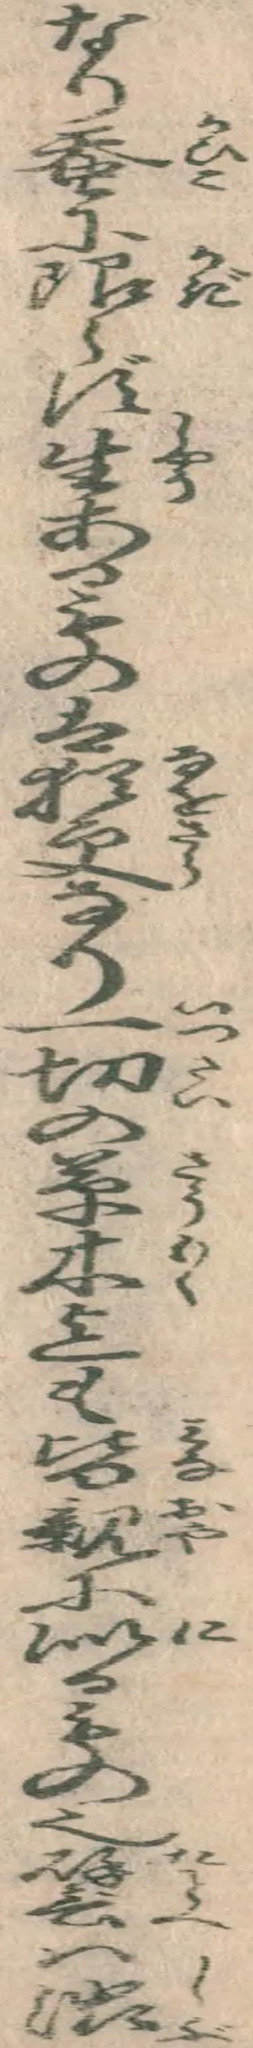なり蚕に限らず生あるものは猶更なり一切の草木迄も皆親に似るもの也譬は渋
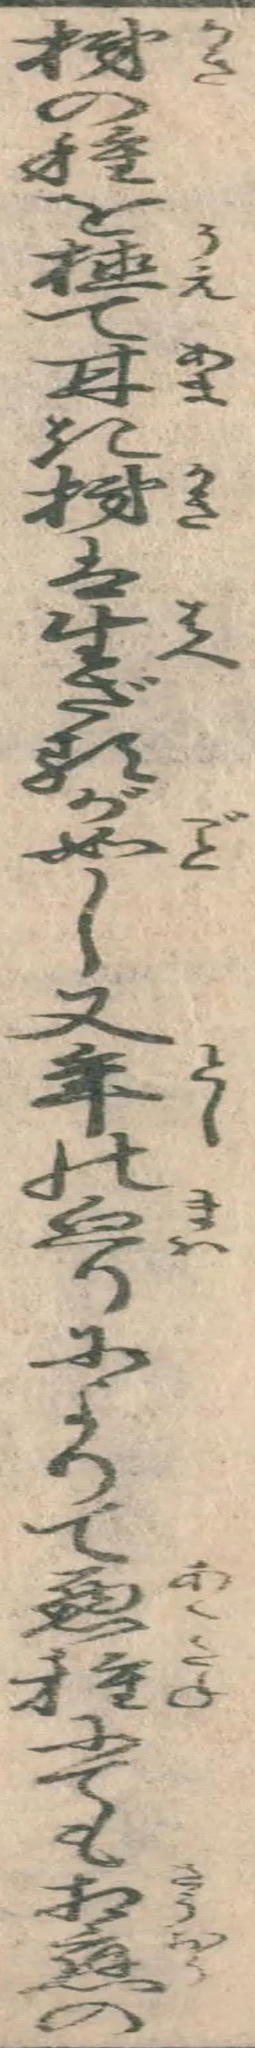柿の種を植て甘き柿は生ざるが如し又年の廻りによりて悪種にても相応の
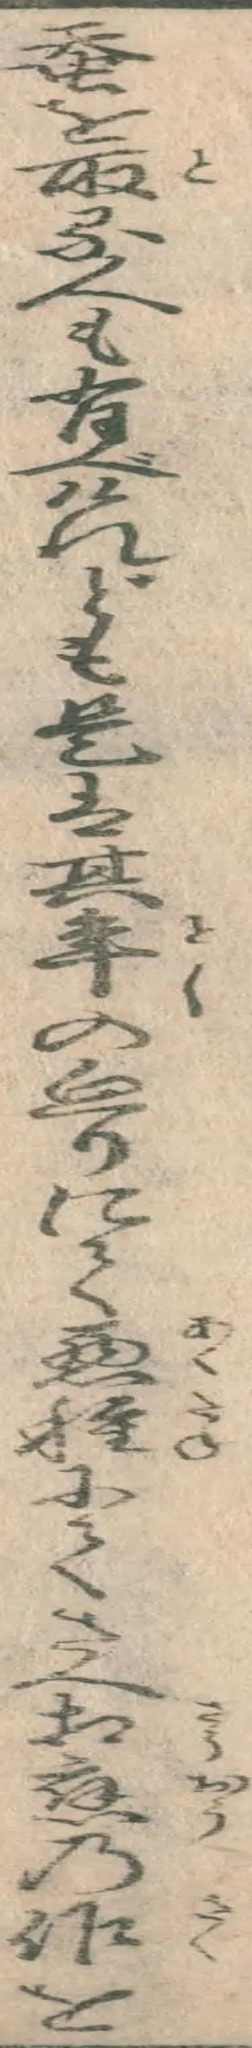蚕を取る人も有べけれども是は其年の廻りにて悪種にてさへ相応の作を
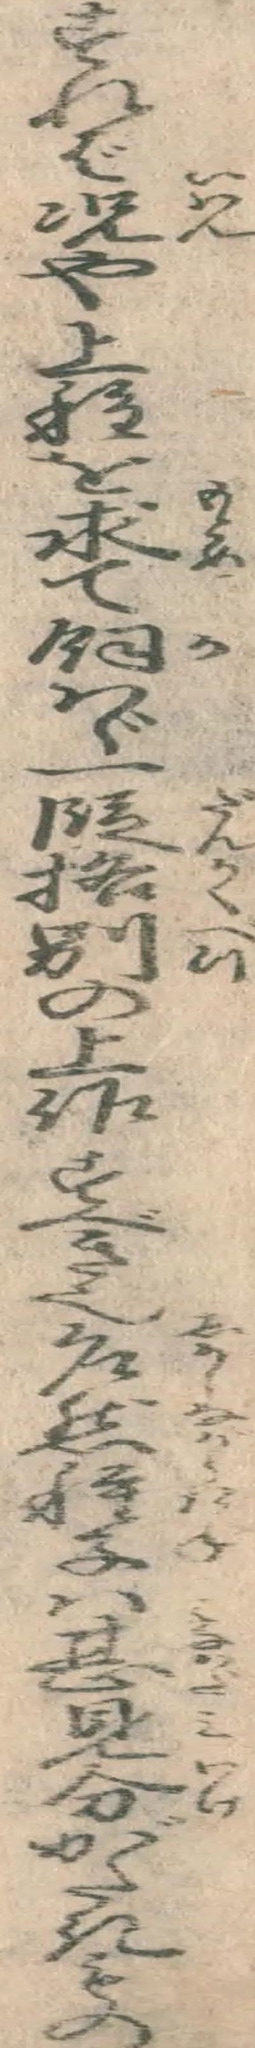すれば況や上種を求て飼はゞ一段格別の上作すべき也乍然種子は甚見分がたきもの
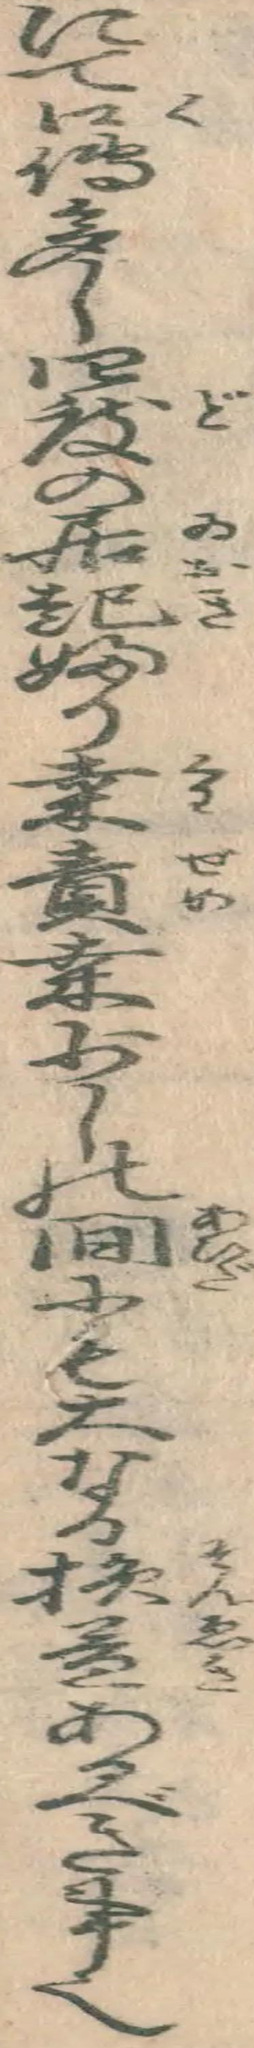にて口伝多し四度の居起ふり桑責桑少しの間にも大なる損益あるべき事也

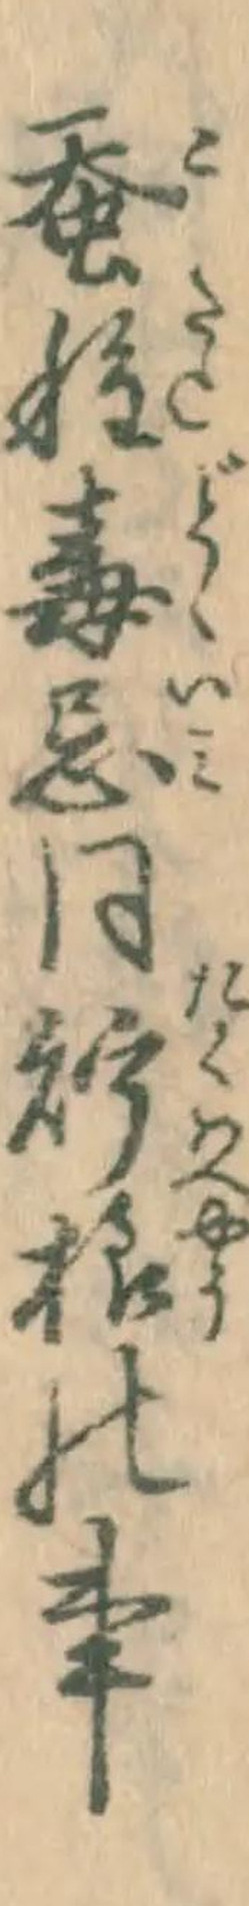蚕種毒忌同貯様の事
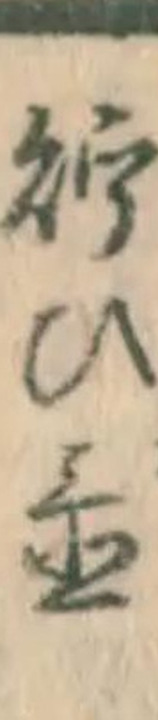貯ひ置
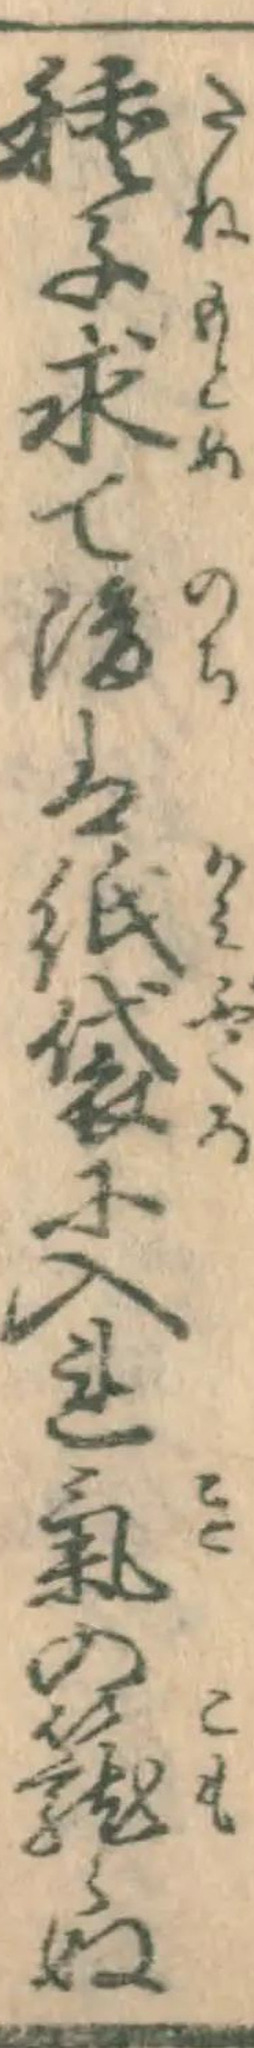種子求て後は紙袋に入れ気の籠らぬ
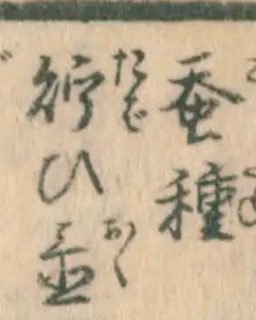貯ひ置
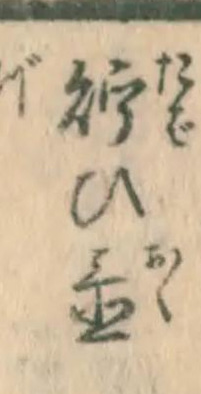貯ひ置
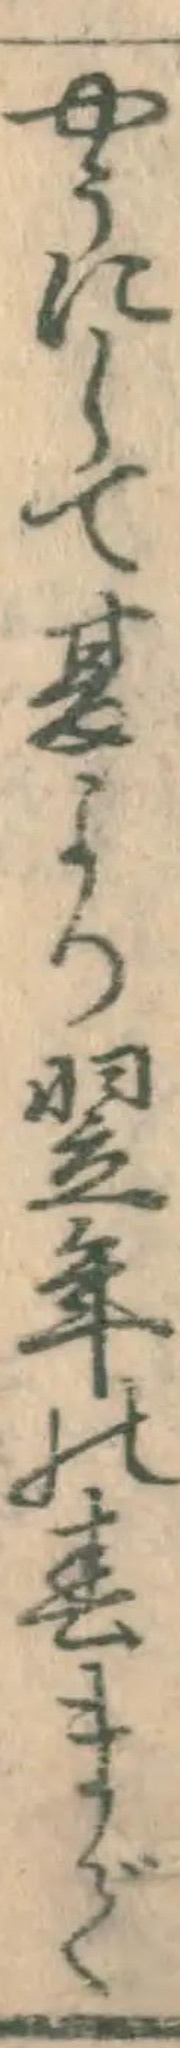やうにして夏より翌年の春まで
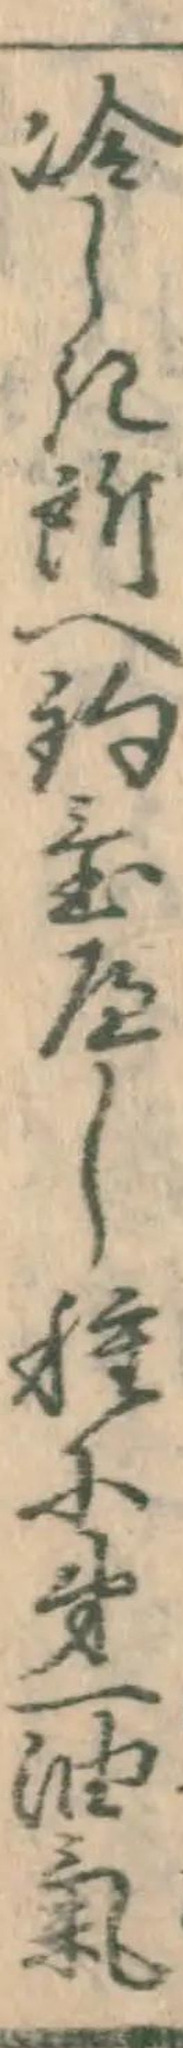冷しき所へ釣置へし種に第一油気
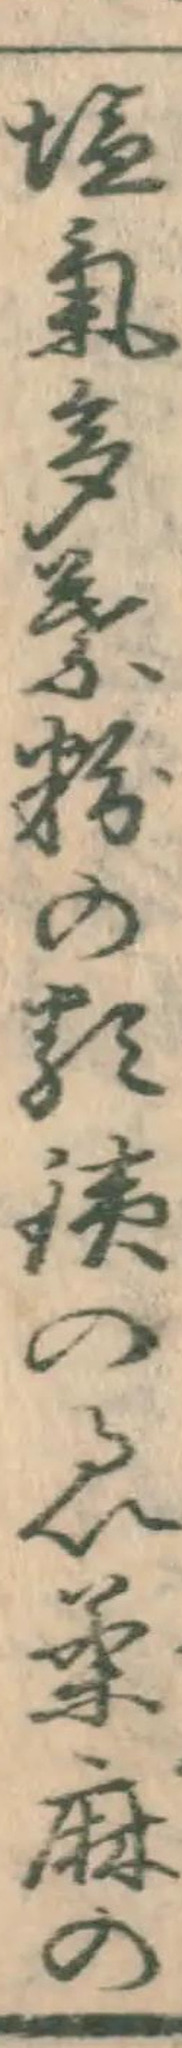塩気多葉粉の類鉄のるい茶麻の
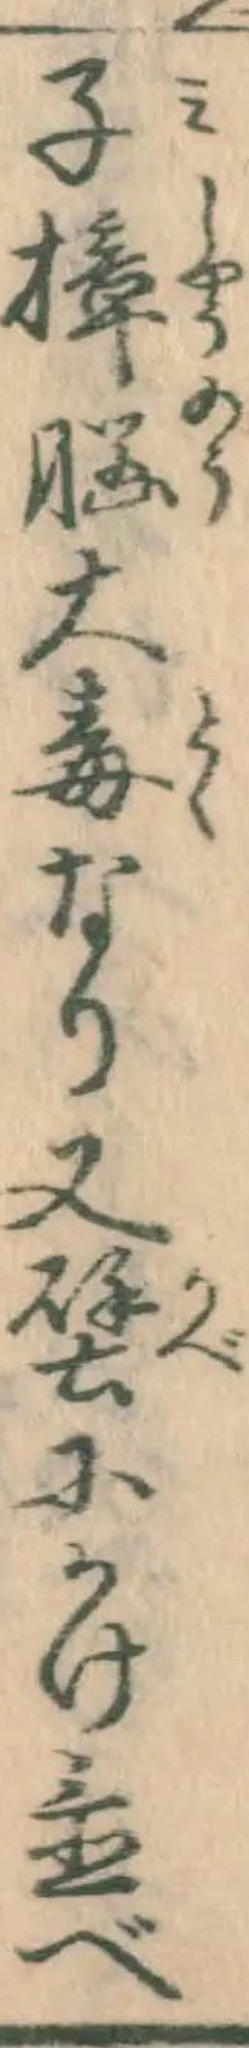子樟脳大毒なり又壁にかけ置べ
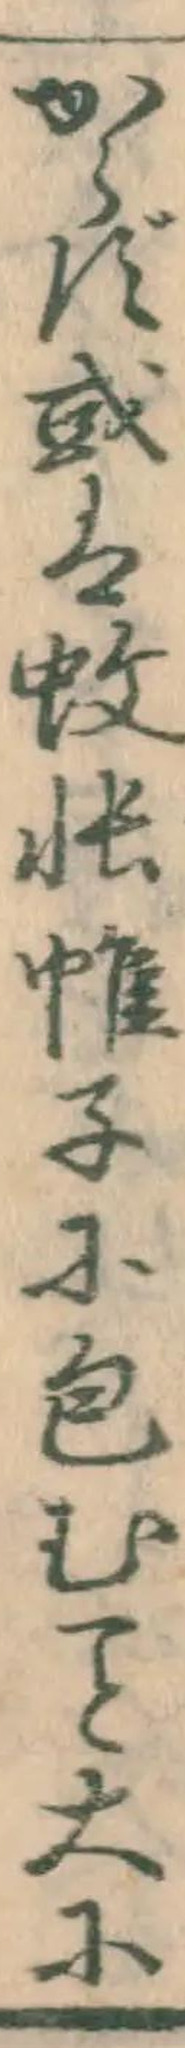からず或は蚊張帷子に包むこと大に
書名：養蚕秘録 3巻. [1]
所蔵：国立国会図書館 National Diet Library, JAPAN
